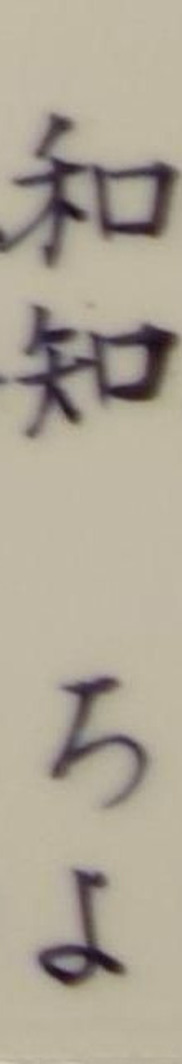和知ちよ
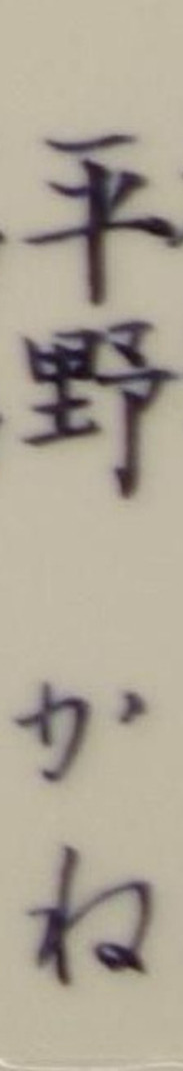平野かね
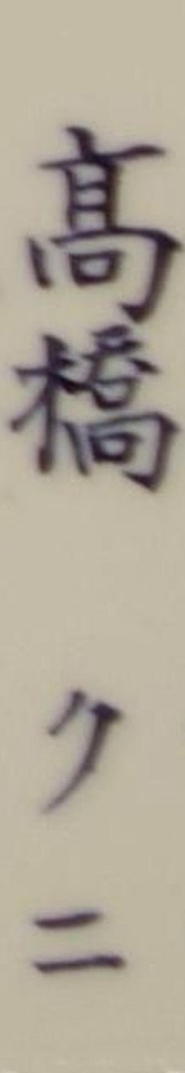高橋クニ
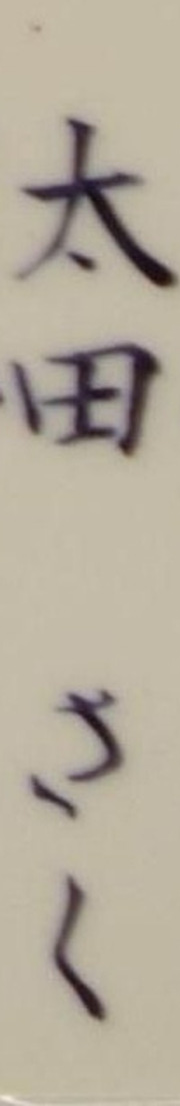太田さく
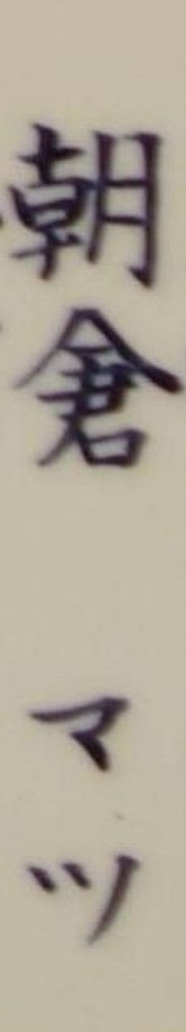朝倉マツ
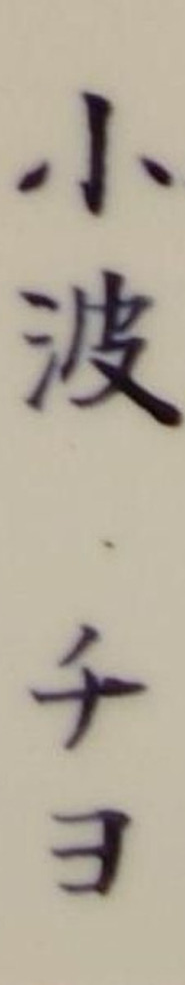小波チヨ
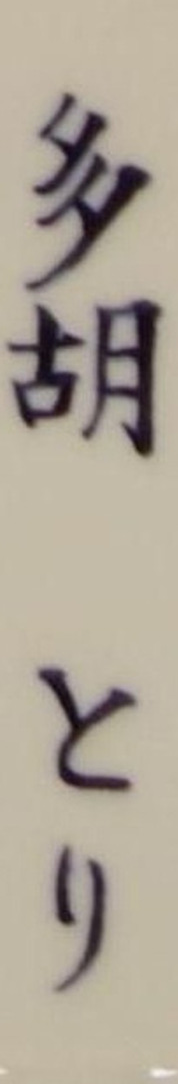多胡とり
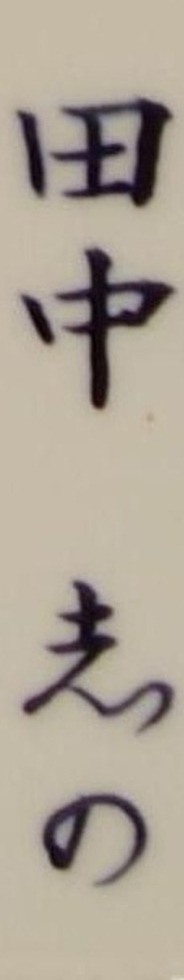田中しの
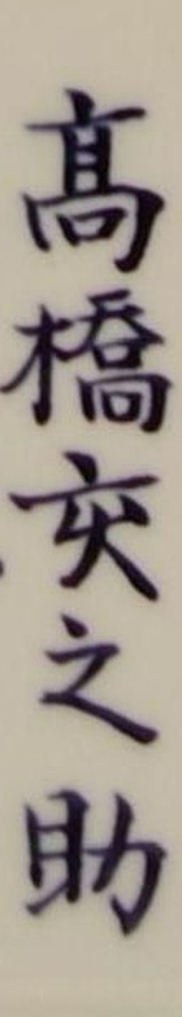高橋交之助
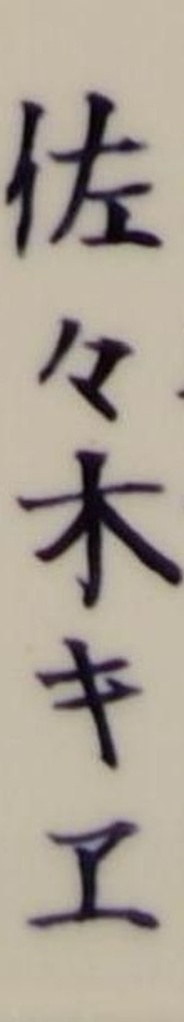佐々木キエ
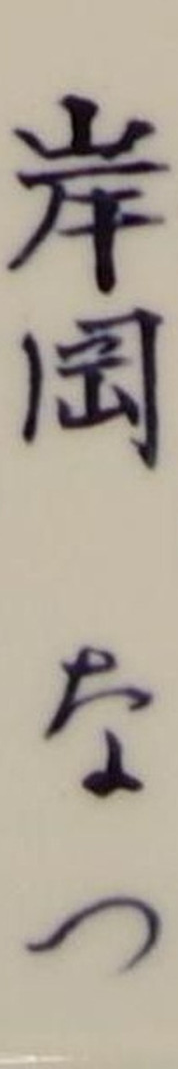岸岡なつ
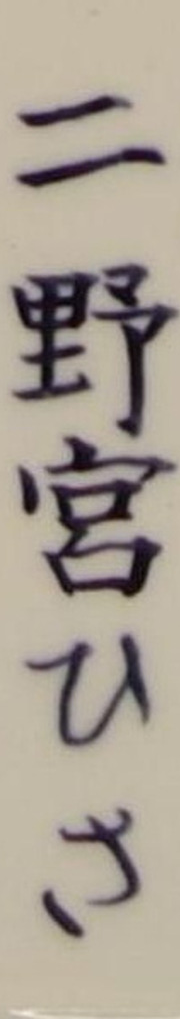二野宮ひさ
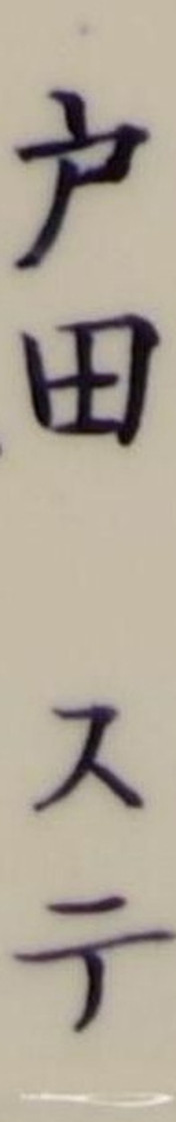戸田ステ
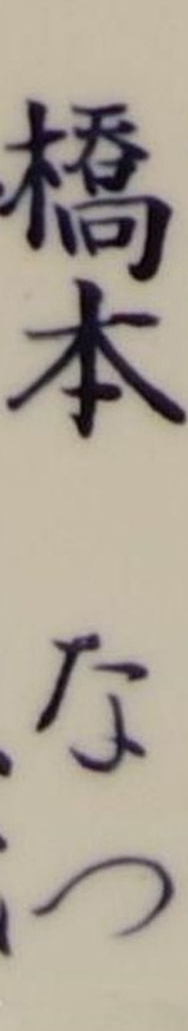橋本なつ
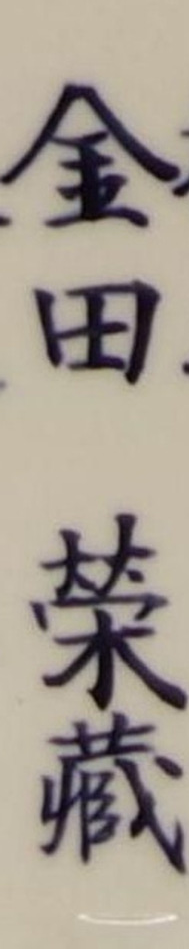金田栄蔵
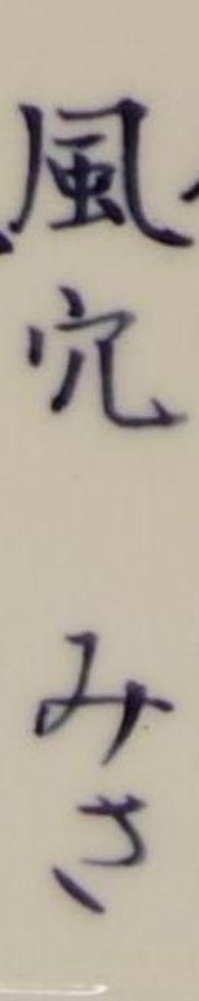風穴みさ
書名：M~S
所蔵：高野山金剛峯寺
